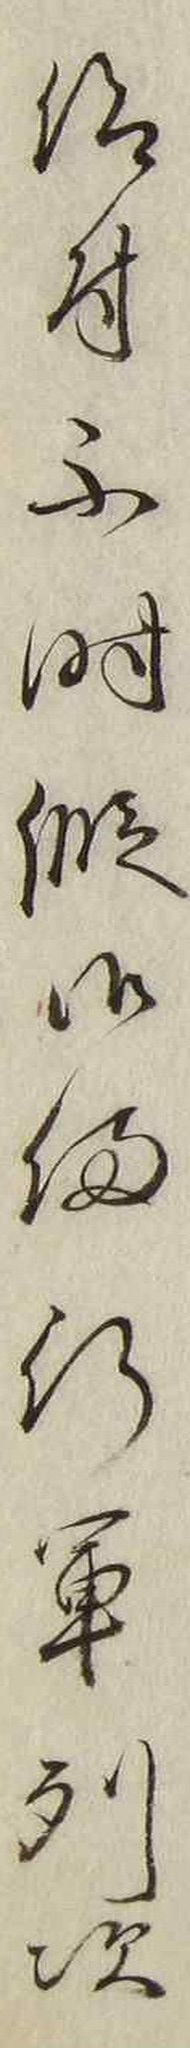仰付候不時仮御備行軍列次

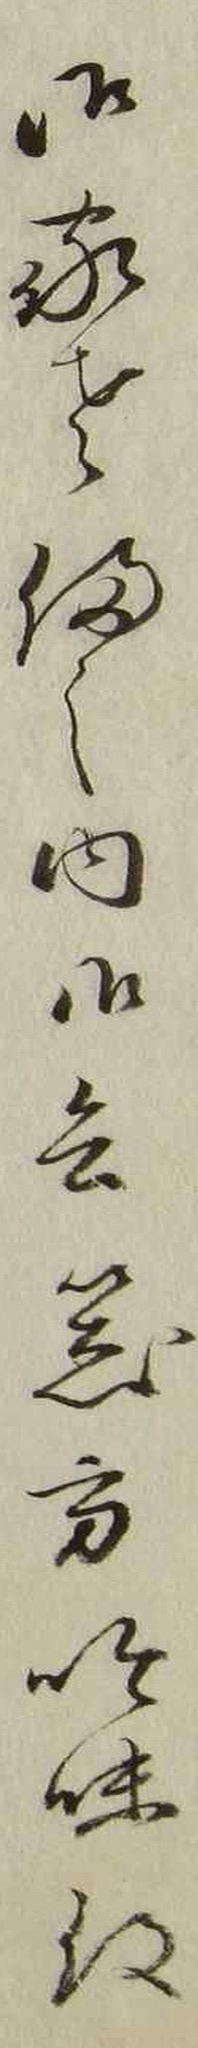御家老備之内御兵器方吟味役
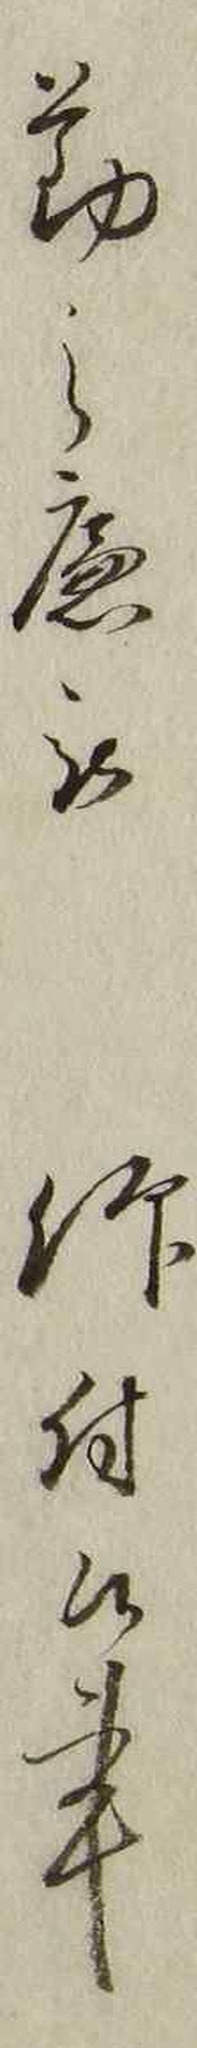勤之廉被仰付候事
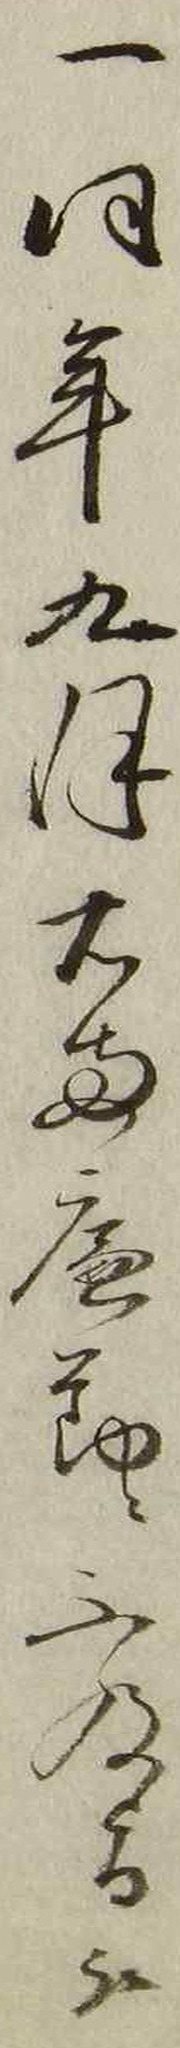一同年九月右両廉勤ニ不及旨被
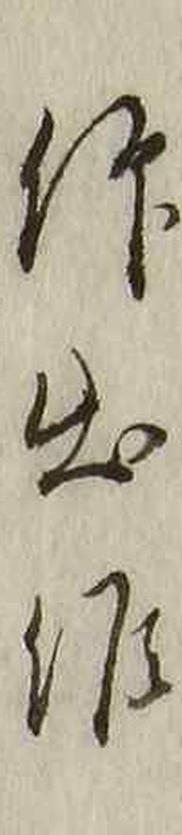仰出候
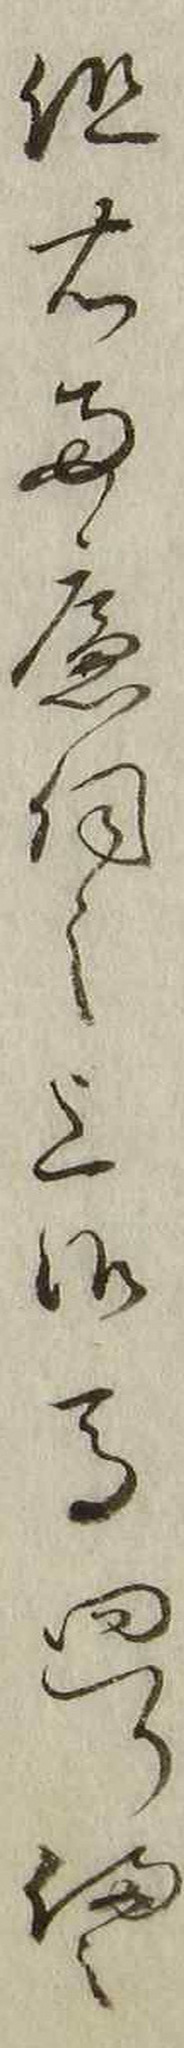但右両廉伺之上御馬廻り備之
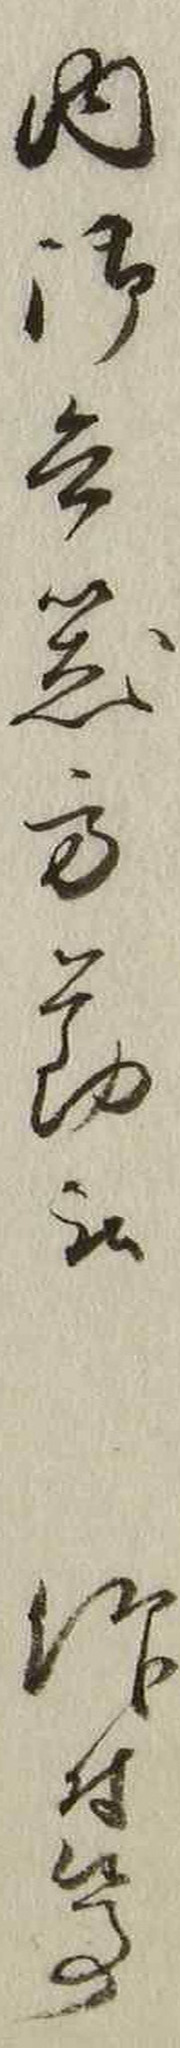内御兵器方勤被仰付候事
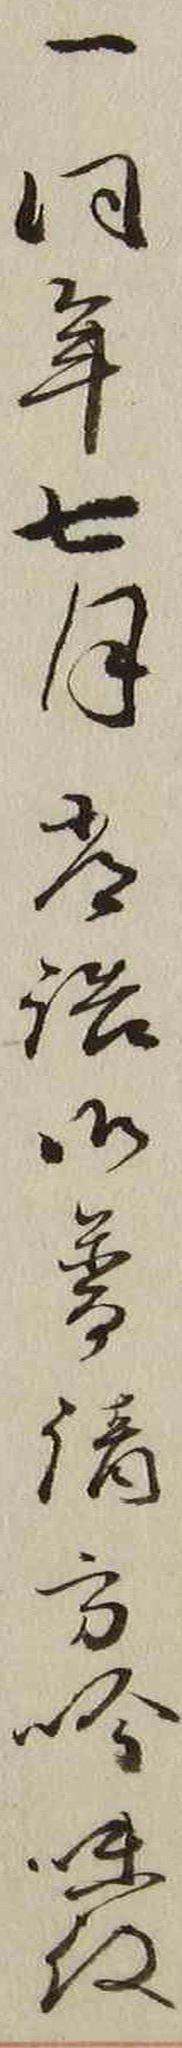一同年七月常詰御普請方吟味役
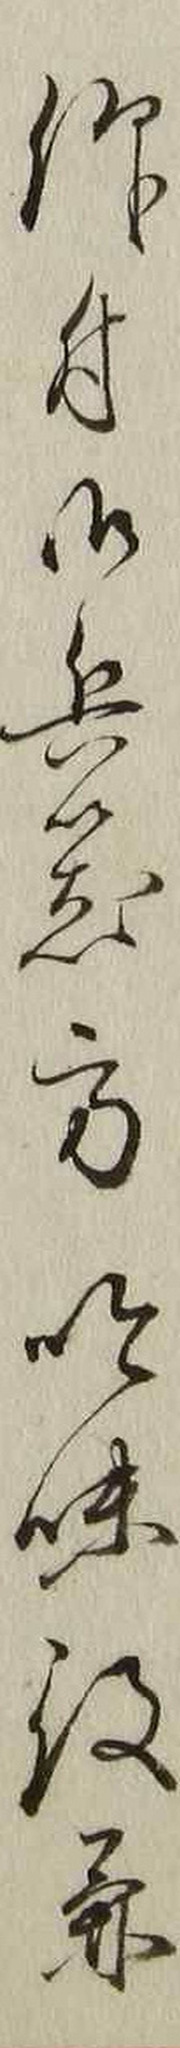被仰付御兵器方吟味役兼
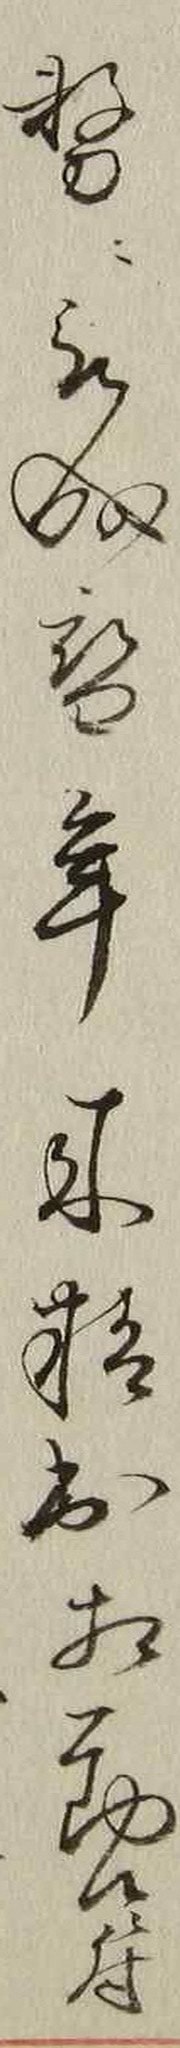務ニ被成替年来精出相勤候ニ付
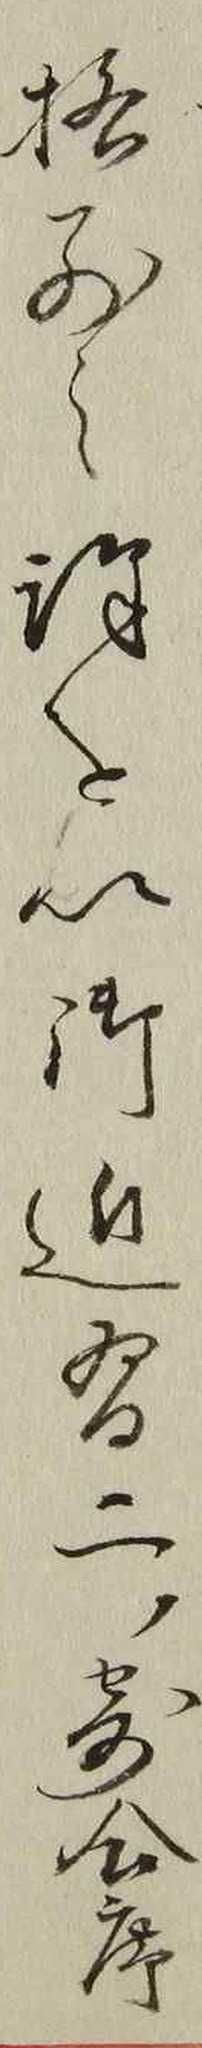格別之訳を以御近習二ノ寄合席
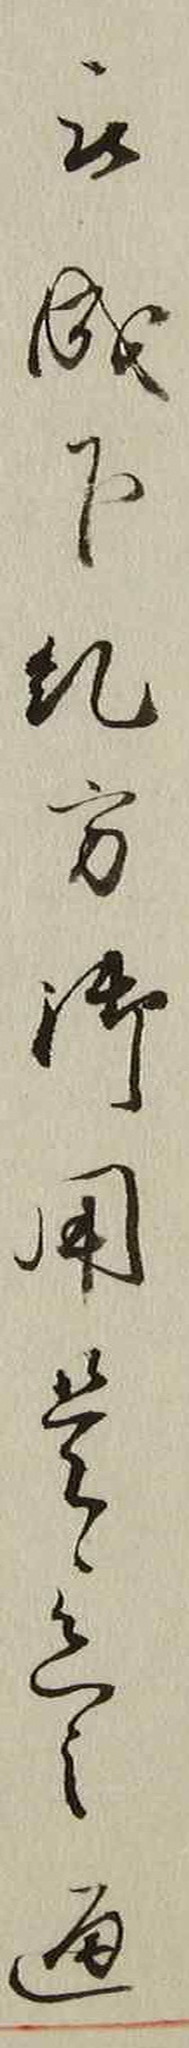被成下糺方御用是迄之通
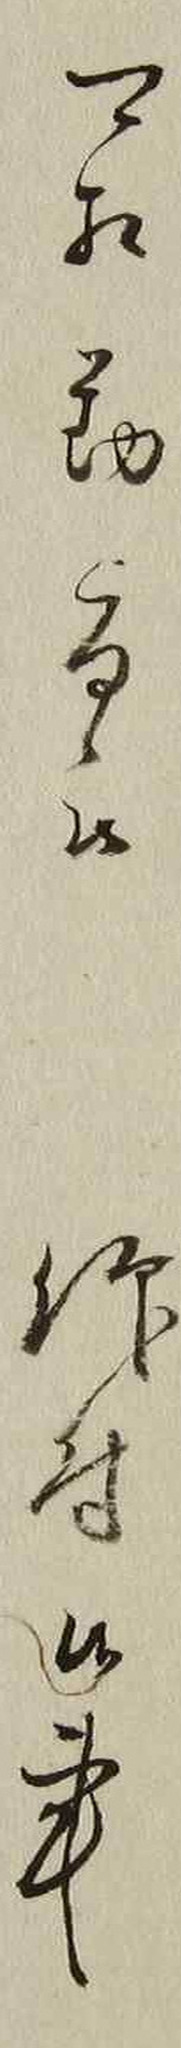可相勤旨被仰付候事
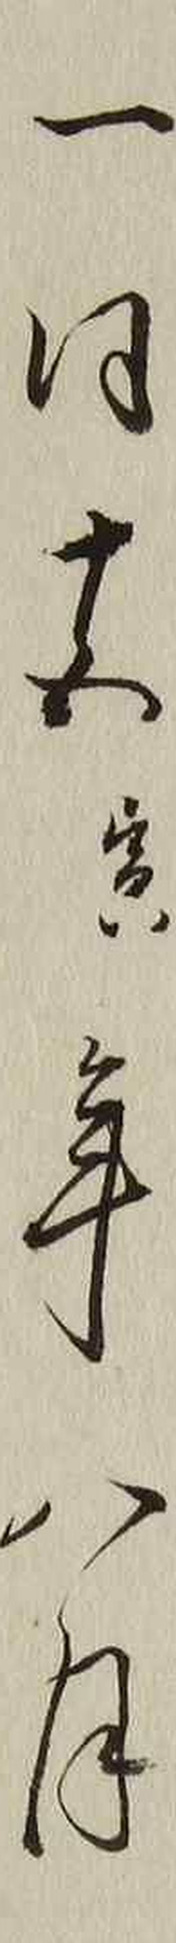一同十五寅年八月
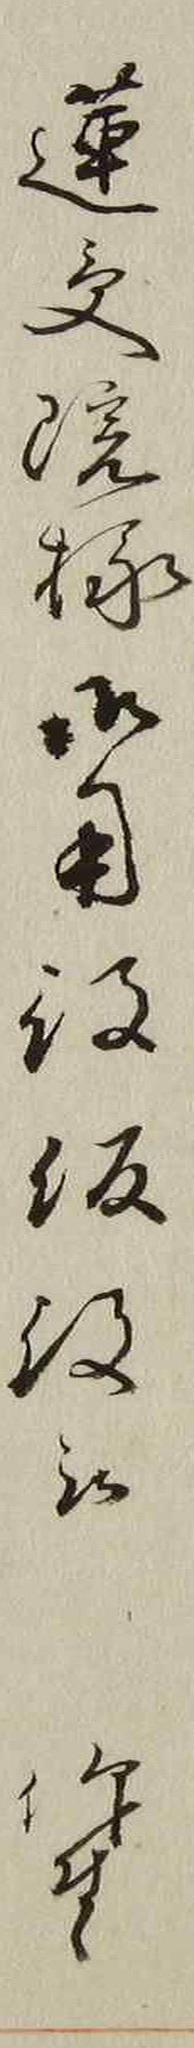蓮受院様御用役仮役被仰付候
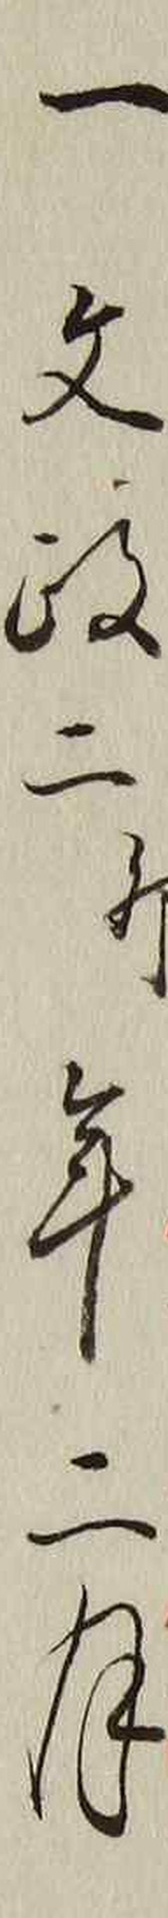一文政二卯年二月
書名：諸士系譜　巻之8　い之部8
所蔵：会津若松市立会津図書館
